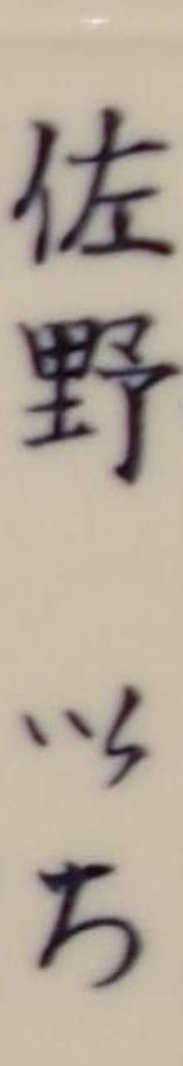佐野いち
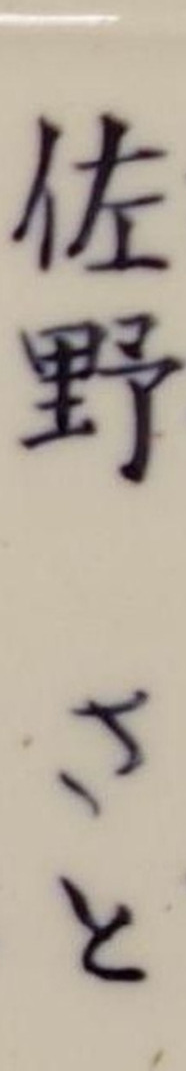佐野さと
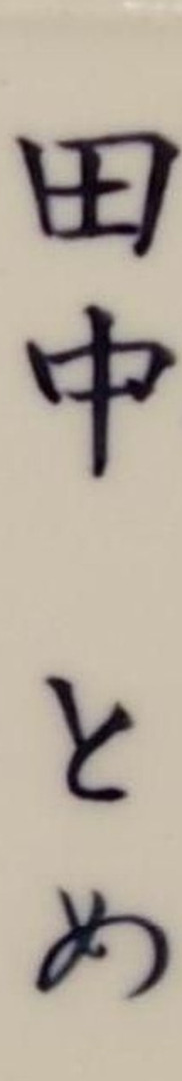田中とめ
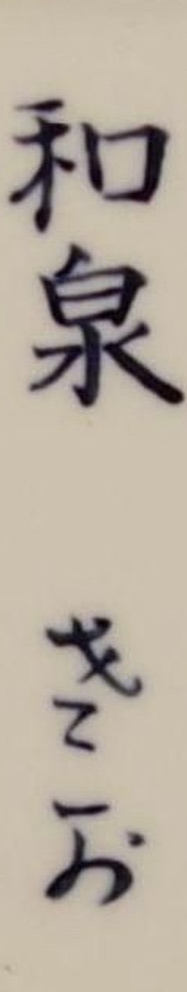和泉さが
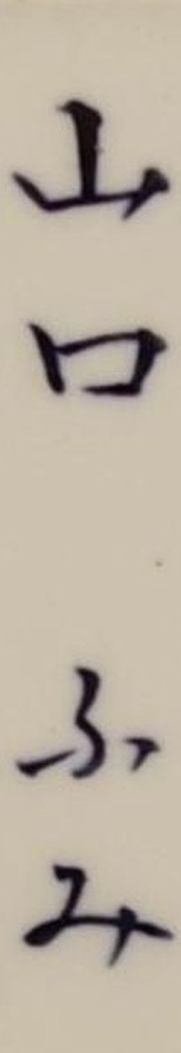山口ふみ
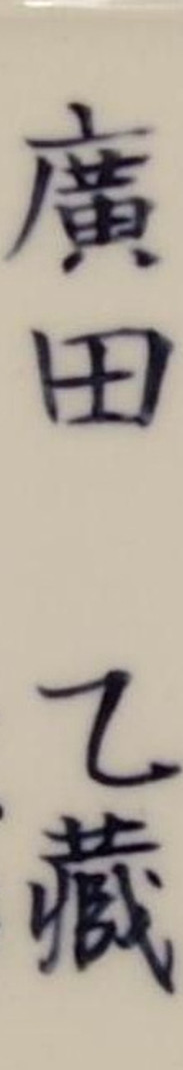廣田乙蔵
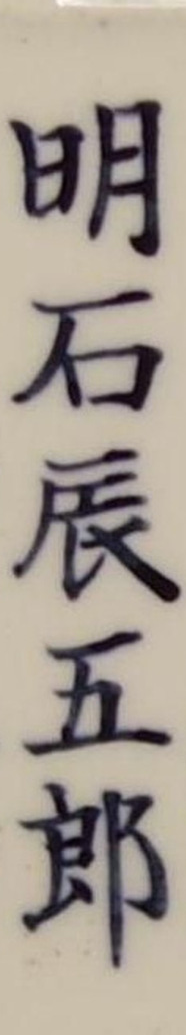明石辰五郎
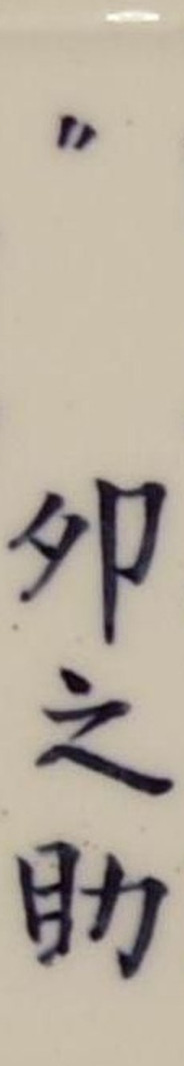卯之助
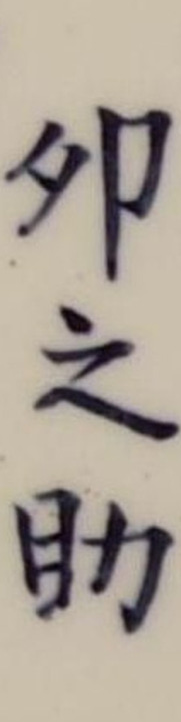卯之助
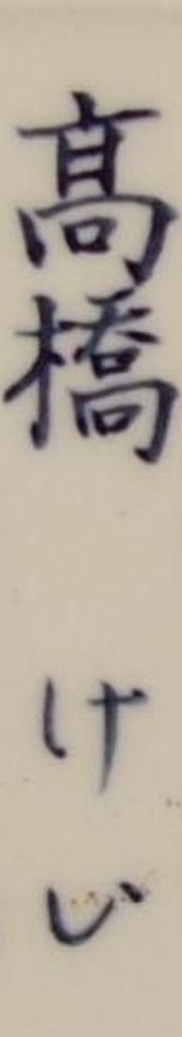高橋けい
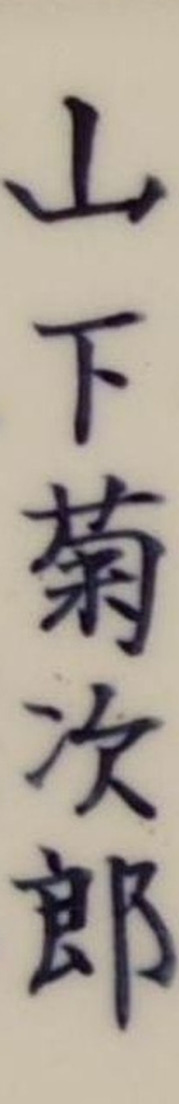山下菊次郎
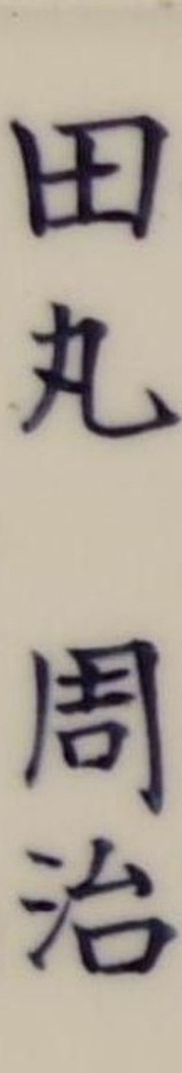田丸周治
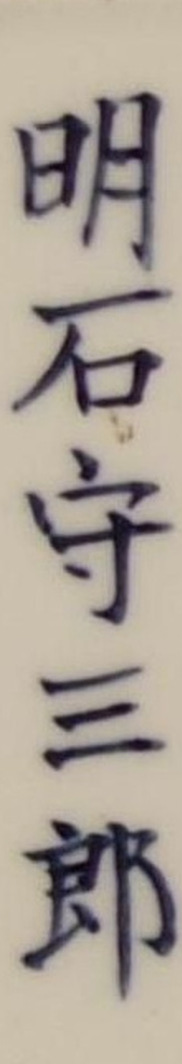明石守三郎
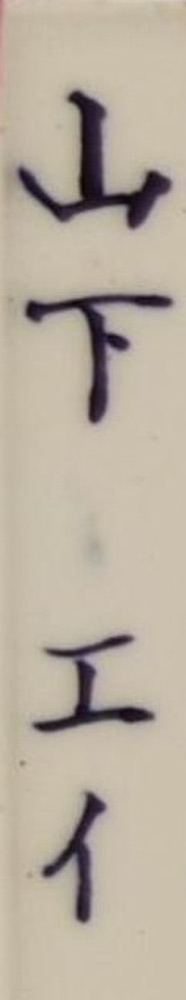山下エイ

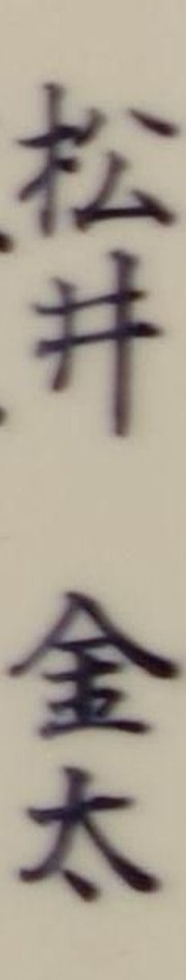松井金太
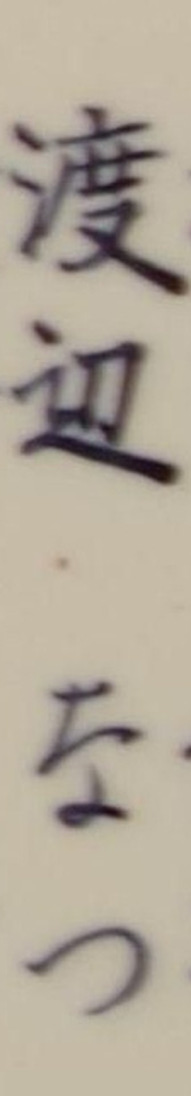渡辺なつ
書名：M~S
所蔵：高野山金剛峯寺
